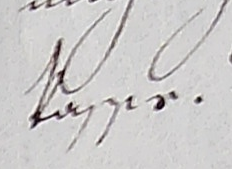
kasse.
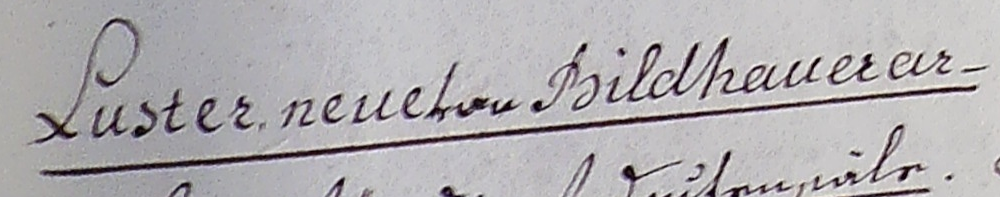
Luster, neue von Bildhauerar_
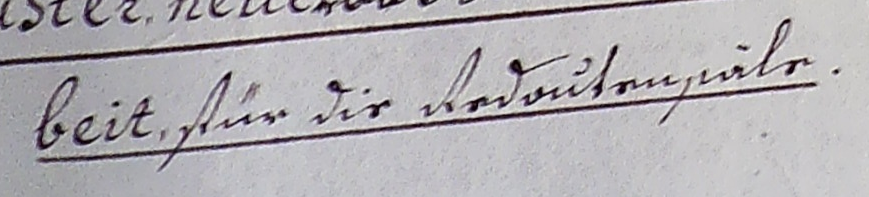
beit, für die Redoutensäle.
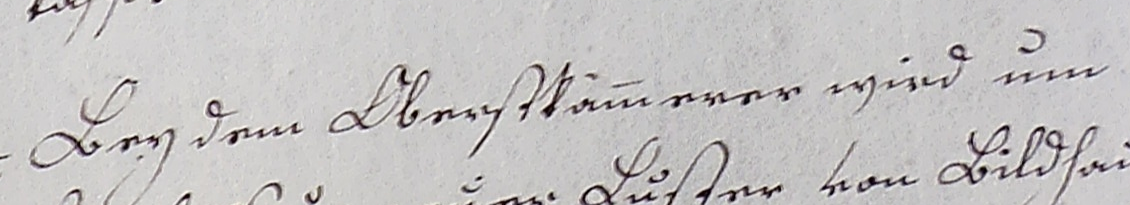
Bey dem Oberstkäm̅erer wird um
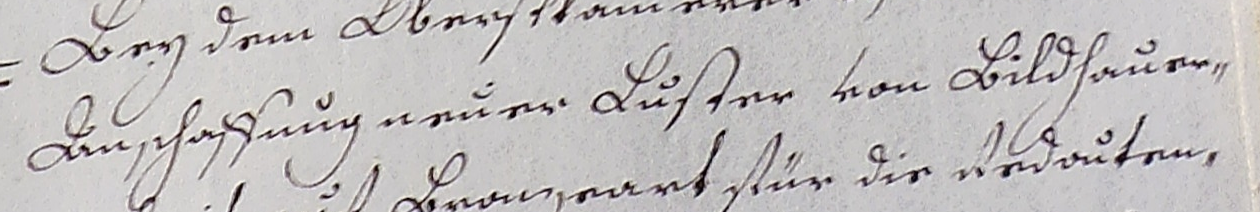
Anschaffung neuer Luster von Bildhauer¬
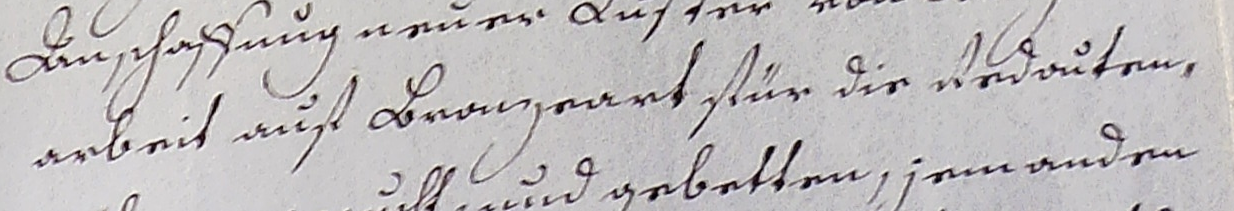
arbeit auf Bronzeart für die Redouten¬
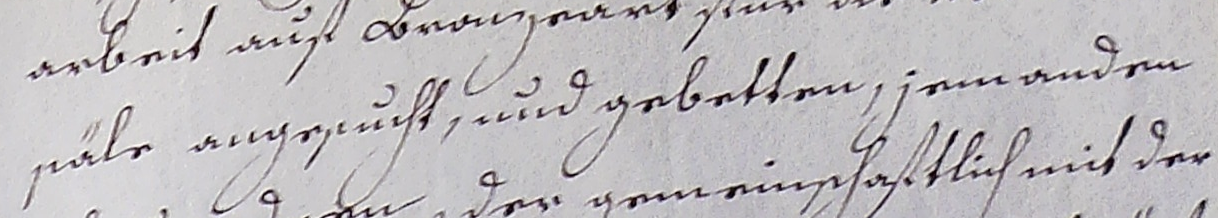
säle angesucht, und gebetten, jemanden
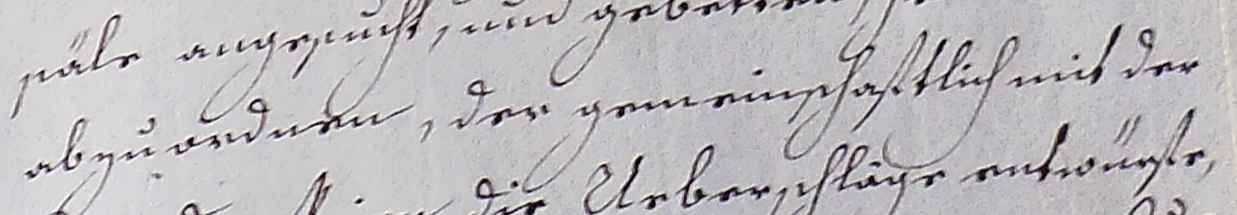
abzuordnen, der gemeinschaftlich mit der
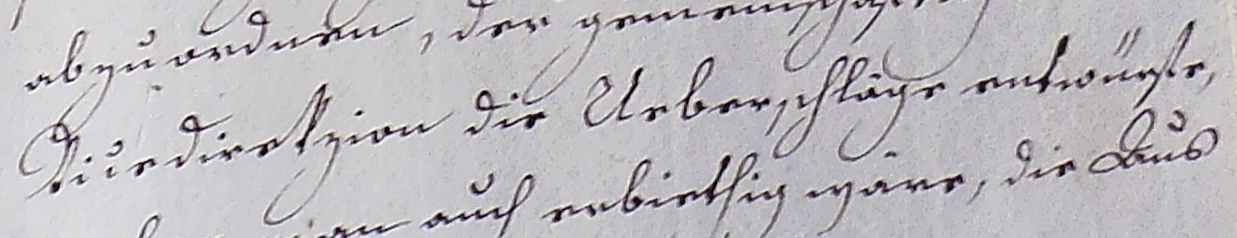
Vicedirekzion die Ueberschläge entwürfe,
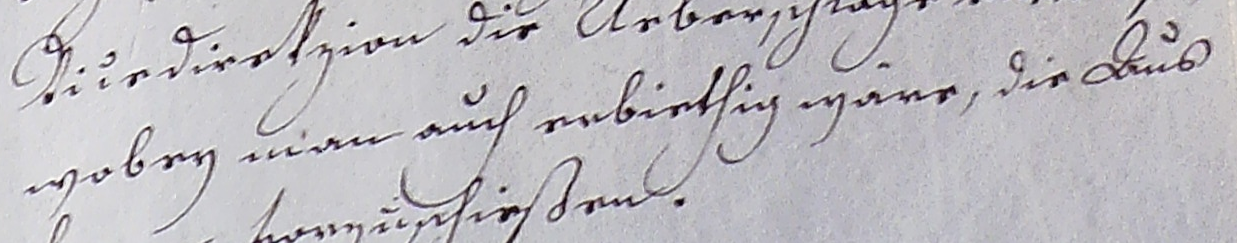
wobey man auch erbiethig wäre, die Aus
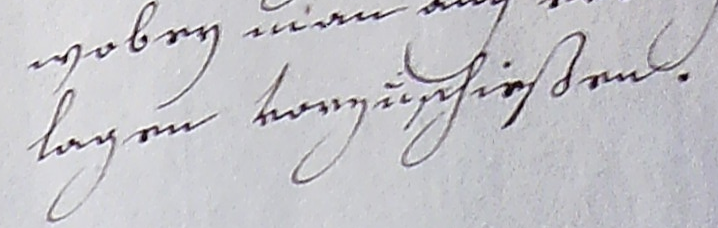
lagen vorzuschießen.
